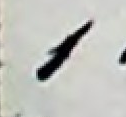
1
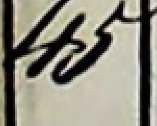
45
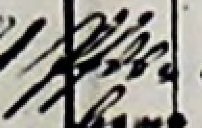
Pfds„
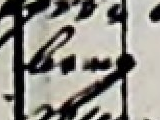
berg
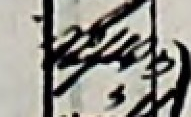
Stift„
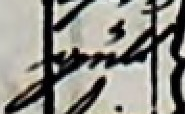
gütt
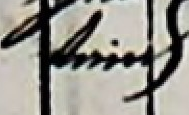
lein
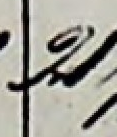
21
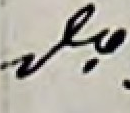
Do
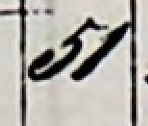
51
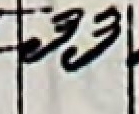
33
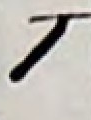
I
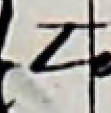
I
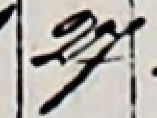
27
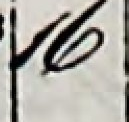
16
